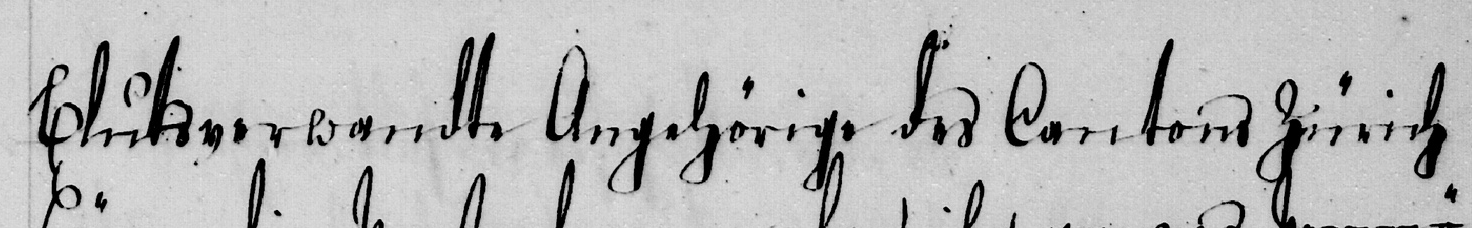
Blutsverwandte Angehörige des Cantons Zürich
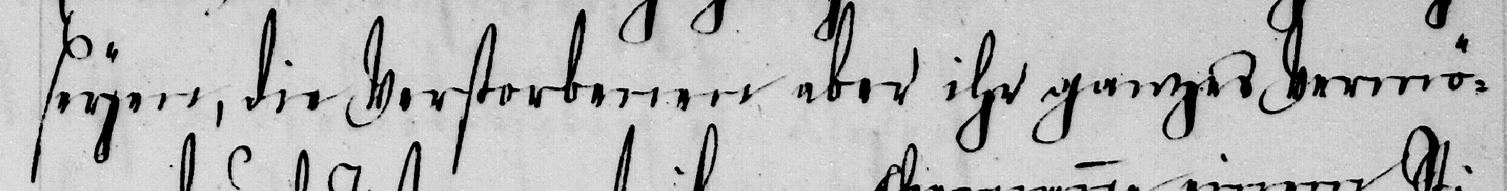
seyen, die Verstorbenen aber ihr ganzes Vermö¬
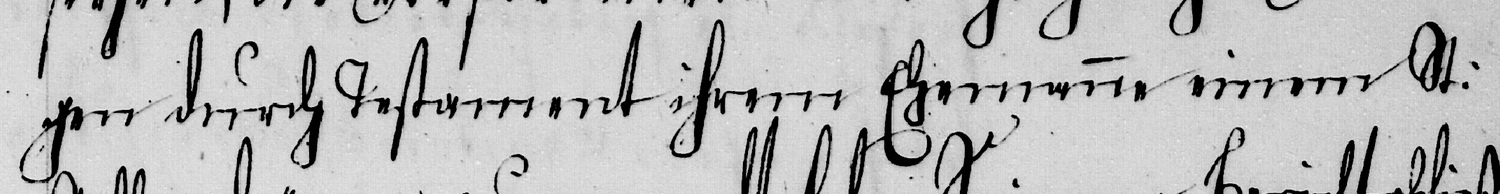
gen durch Testament ihrem Ehemanne einem St.
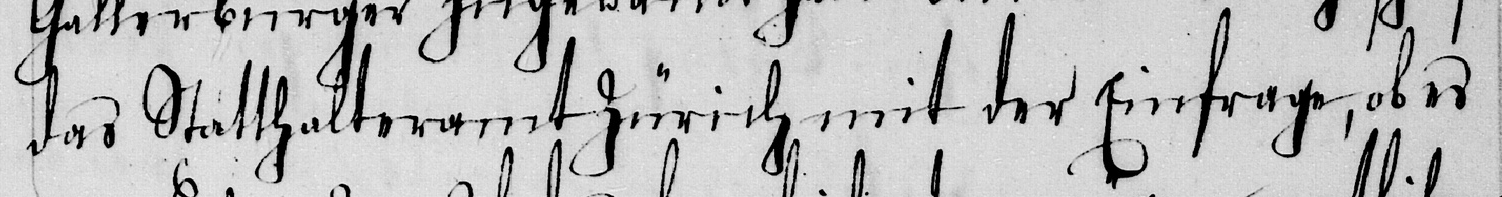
das Statthalteramt Zürich mit der Einfrage, ob es
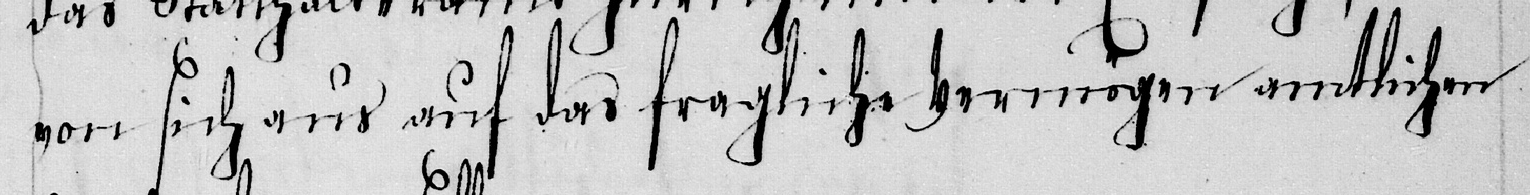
von sich aus auf das fragliche Vermögen amtlichen
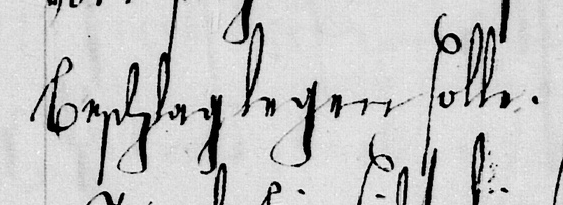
Beschlag legen solle.
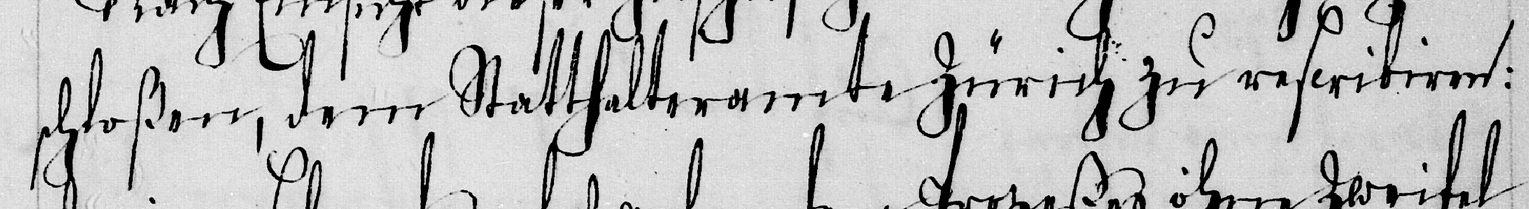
schloßen, dem Statthalteramte Zürich zu rescribiren:
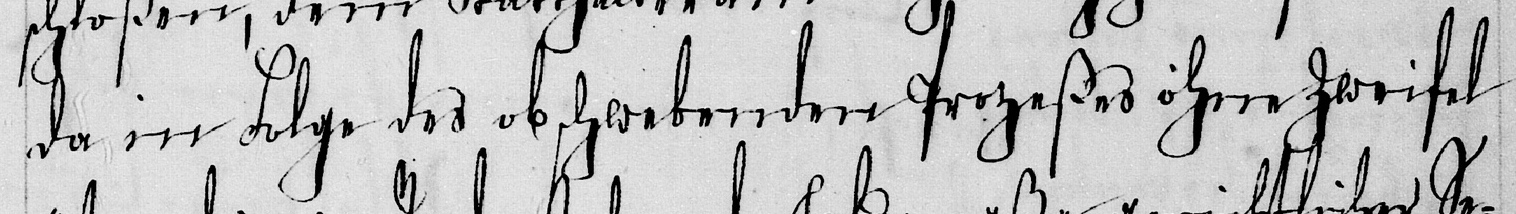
da in Folge des obschwebenden Prozeßes ohne Zweifel
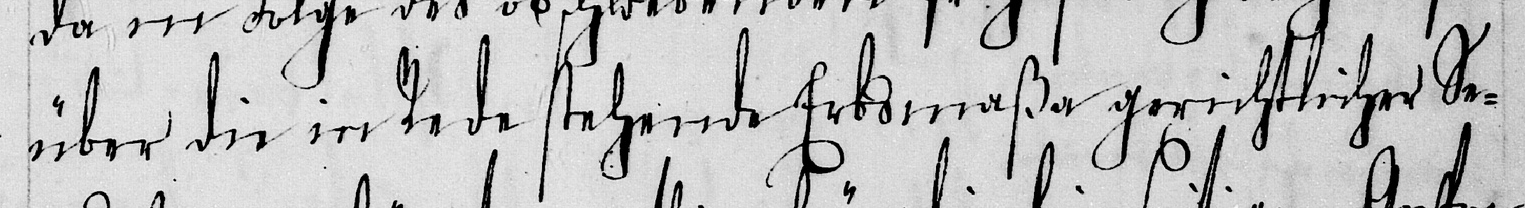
über die in Rede stehende Erbsmaße gerichtlicher Se¬
